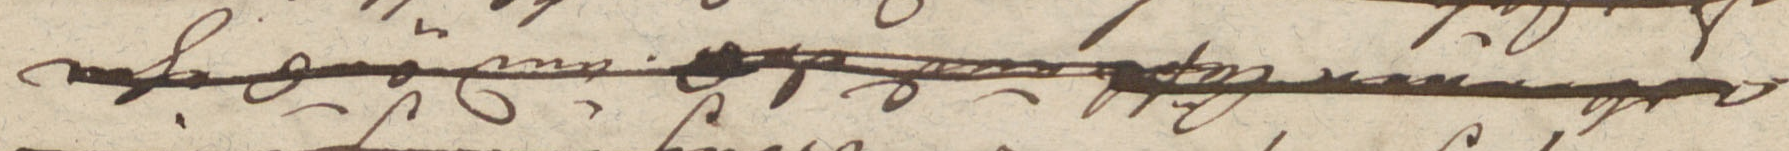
weil sich dieser älteste Brauch deutlich daran
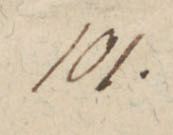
101.
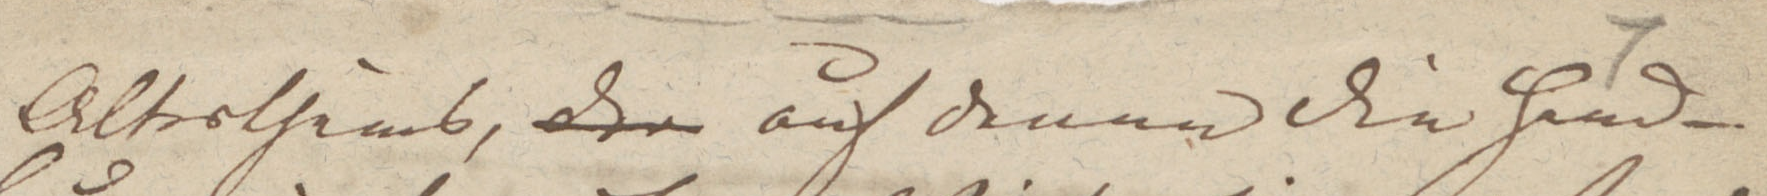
Alterthums, der auf denen die Hand-
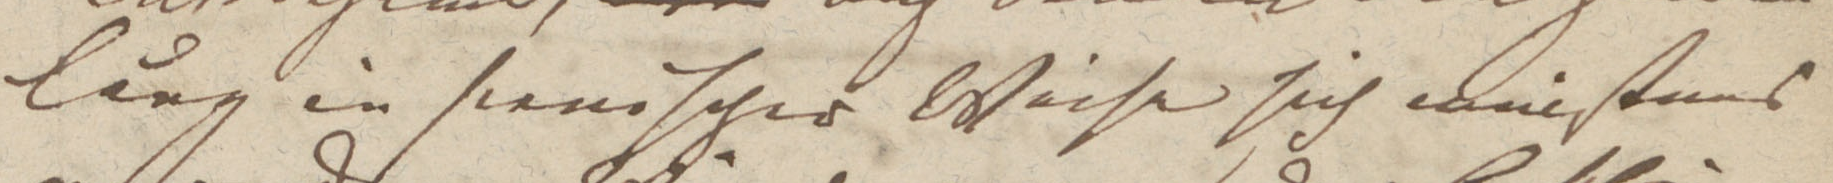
lung in scenischer Weise sich meistens
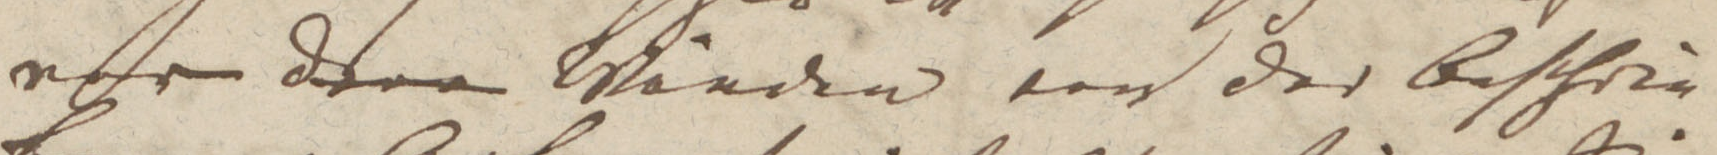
vor d Wänden von der beschrie-
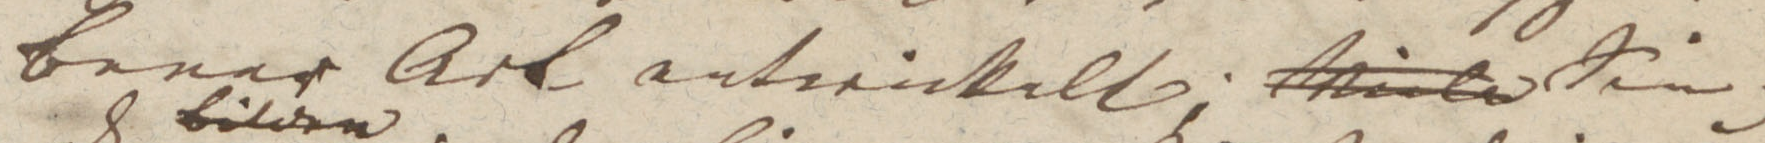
bene Art entwickelt; Viele Sie
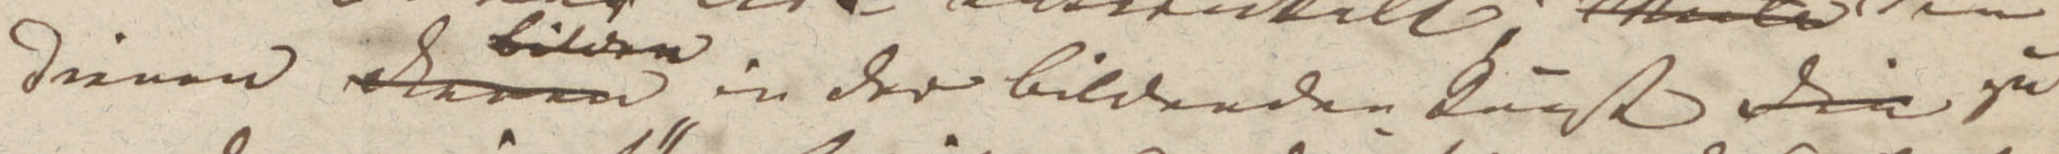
dienen bilden in der bildenden Kunst die zu
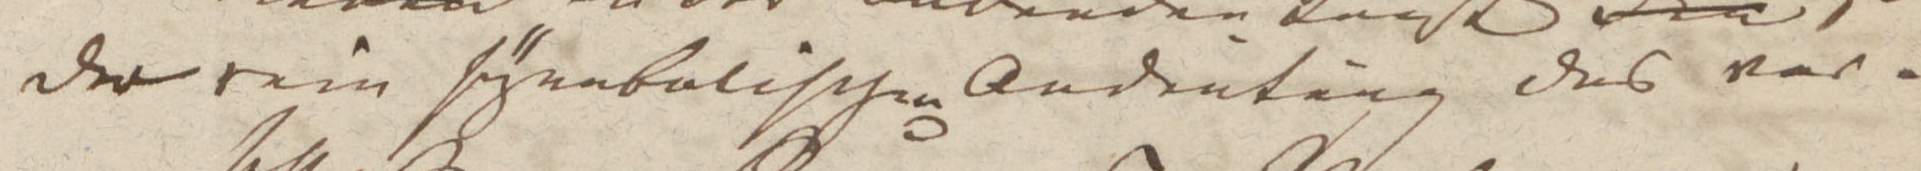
der rein symbolischen Andeutung des ver-
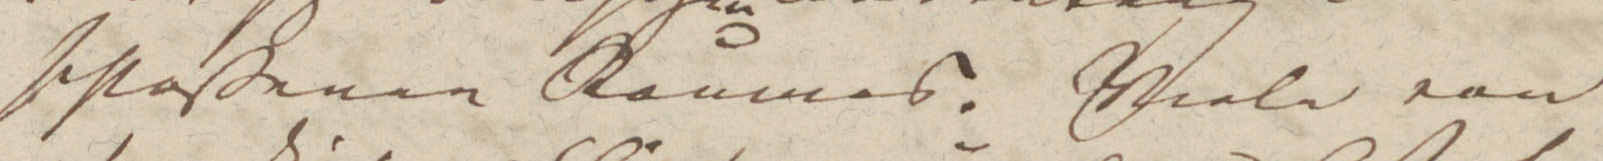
schlossenen Raumes. Viele von
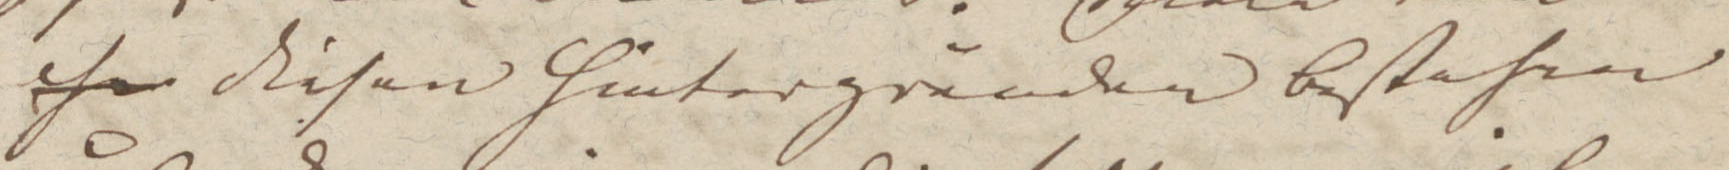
ihn diesen Hintergründen bestehen
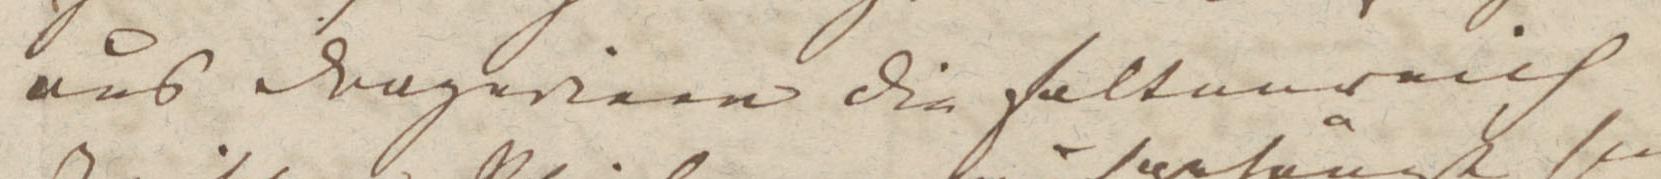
aus Draperieen die faltenreich
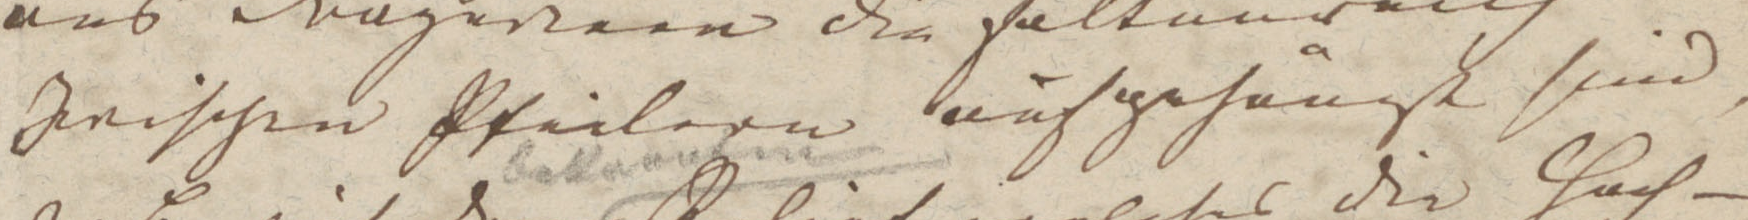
zwischen Pfeilern aufgehängt sind,
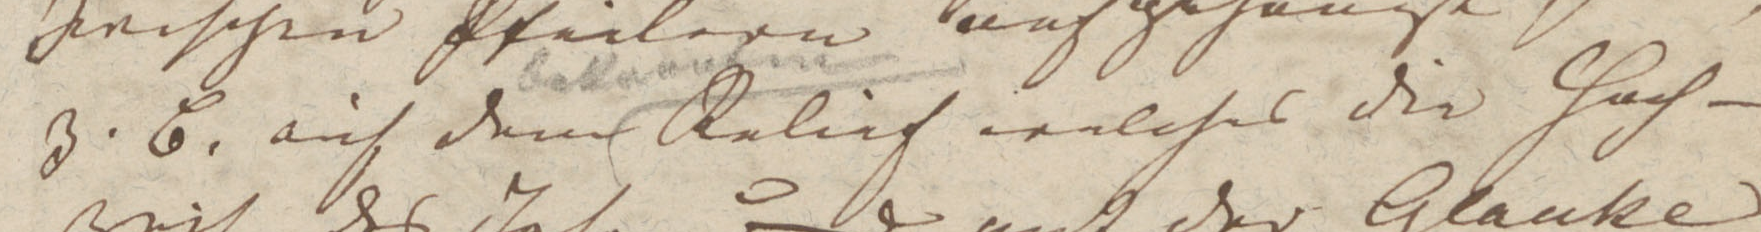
z. B. auf dem bekannten Relief welches die Hoch-
